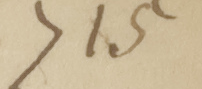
715
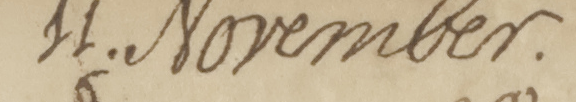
11. November.
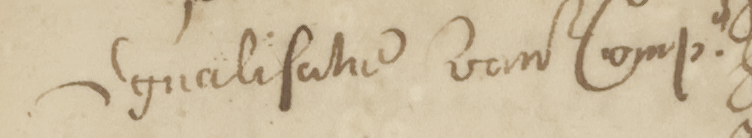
Egualisatie van Compen.
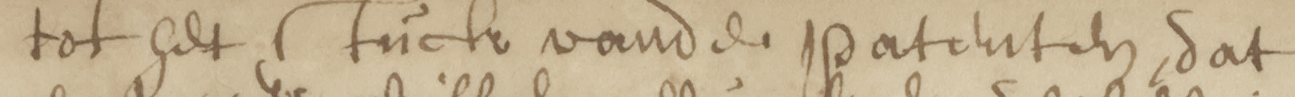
tot het stuck vande patenten, dat
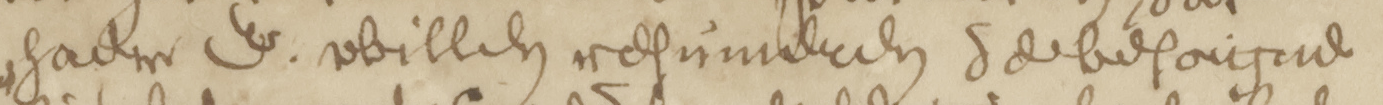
haer E. willen resumeren de besogne
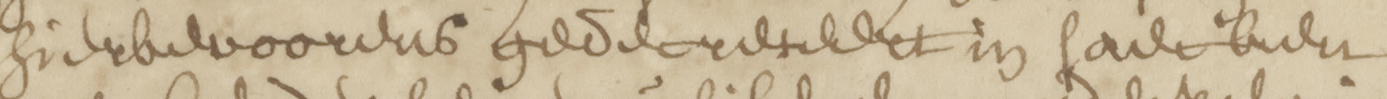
hierbevoorens gedecreteert in saecken
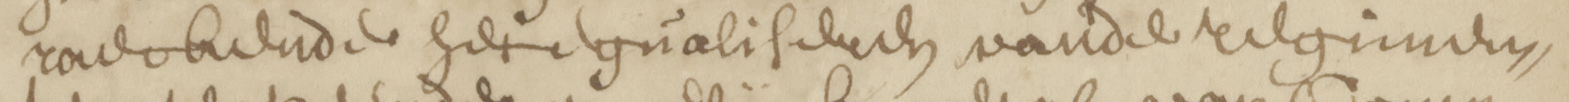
raeckende het egualiseren vande regimen„
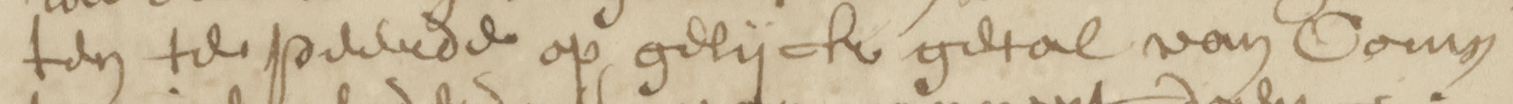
ten te peerde op gelijck getal van Com„
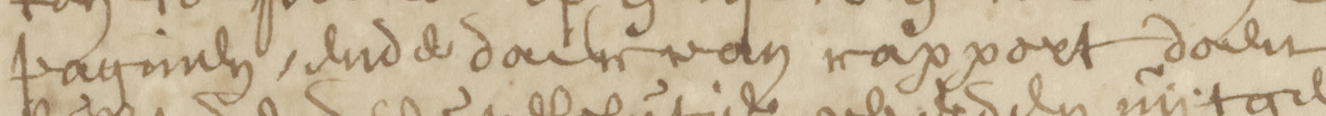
pagnien, ende daervan rapport doen
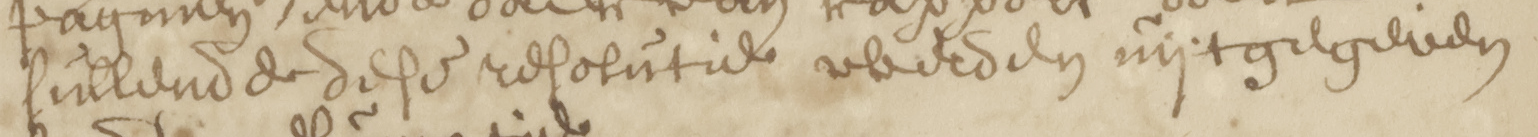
sullende dese resolutie werden uijtgegeven
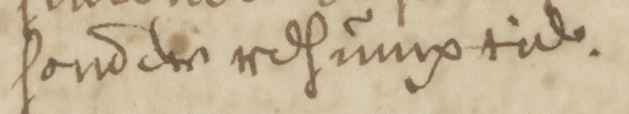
sonder resumptie.
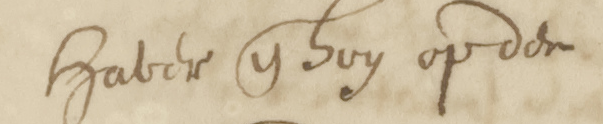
haver & hoy opden
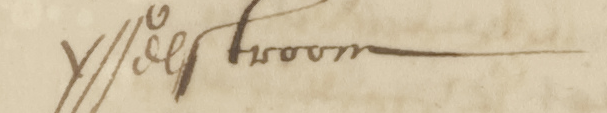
ysselstroom
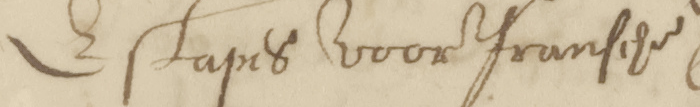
Estapes voors fransche
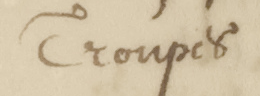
Troupes
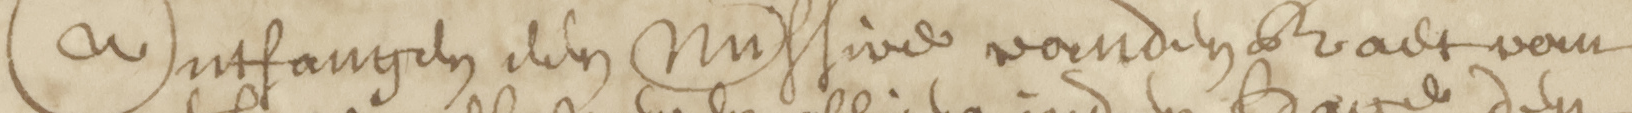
Ontfangen een missive vanden Raet van
